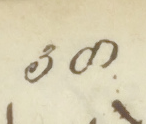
38.
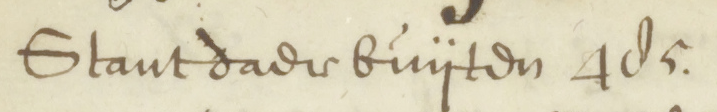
Stantdaerbuijten 485.
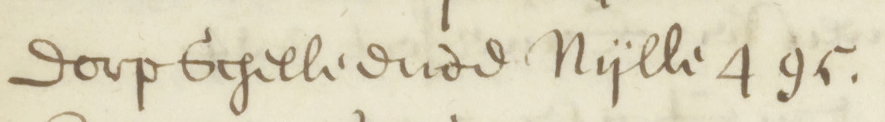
Dorp Schelle ende Nijlle 495.
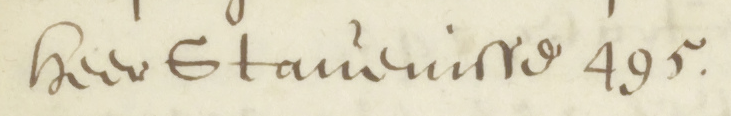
heer Stauenisse 495.
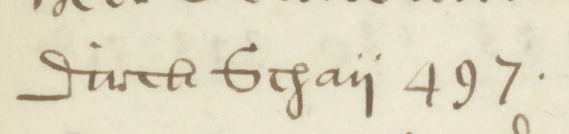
Dirck Schaij 497.
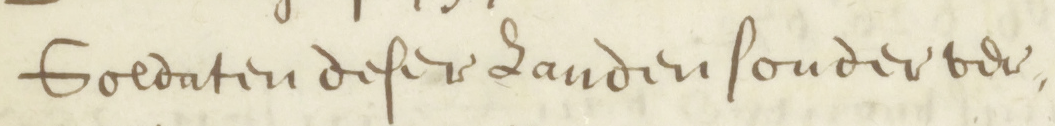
Soldaten deser Landen sonder ver„
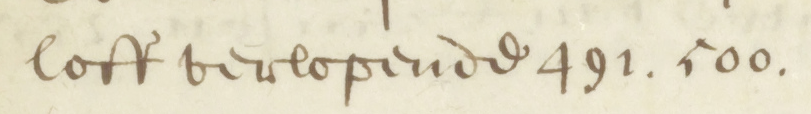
loff verlopende 491. 500.
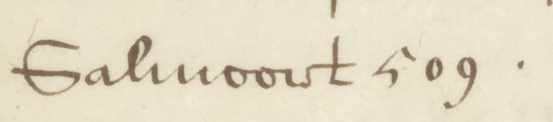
Salmoort 509.
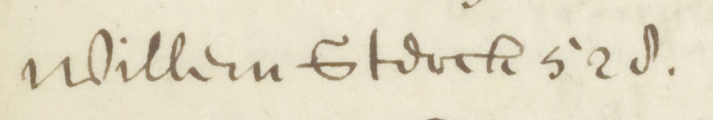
Willem Sterck 528.
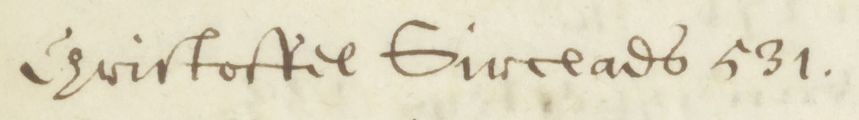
Christoffel Sirclaes 531.
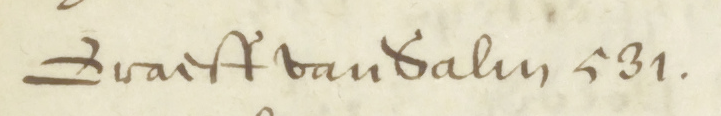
Graeff van Salm 531.
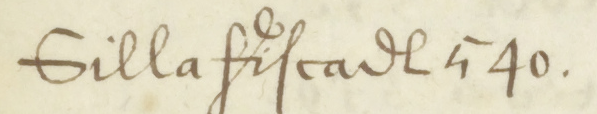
Silla Fiscael 540.
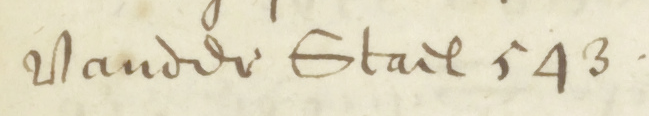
Vander Stael 543.
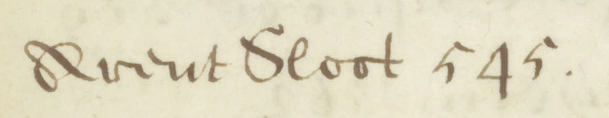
Arent Sloot 545.
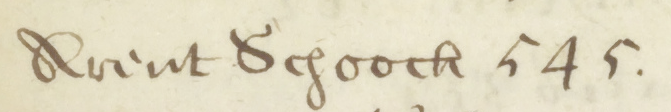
Arent Schoock 545.
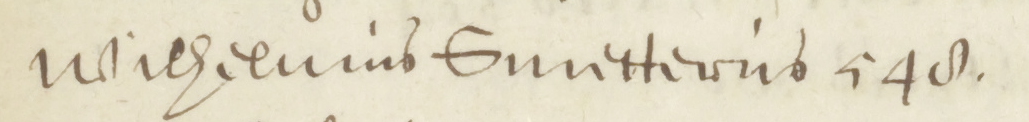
Wilhelmus Smetterus 548.
